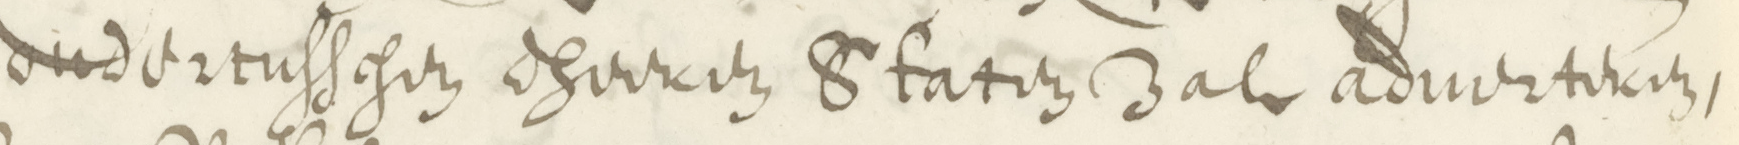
ondertusschen dheeren Staten zal aduerteren,
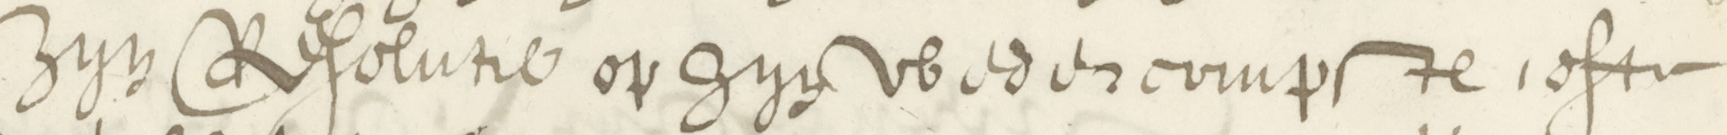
zyn Resolutie op zyn wedencompste, ofte
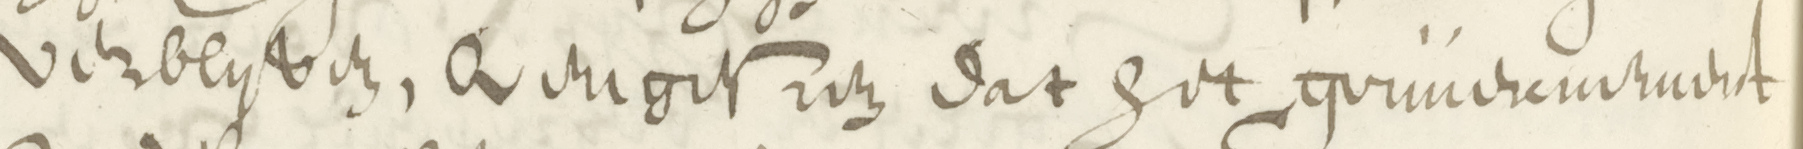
verblyven, aengesien dat het gouuernement
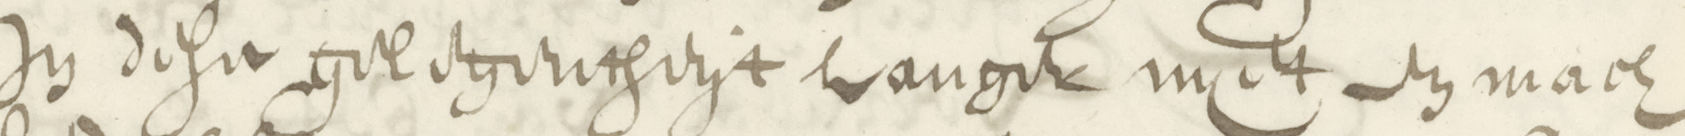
in dese gelegentheijt langer nyet en mach
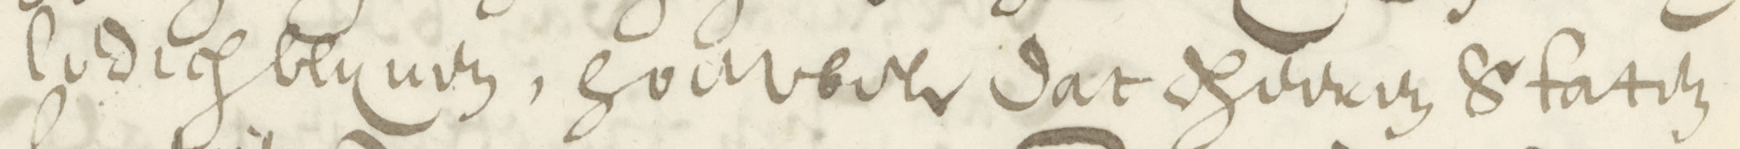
ledich blyven, hoewel dat dheeren Staten
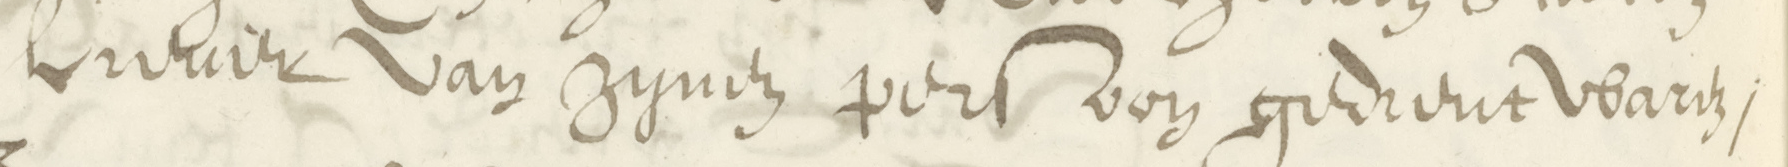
liever van zynen persoon gedient waren;
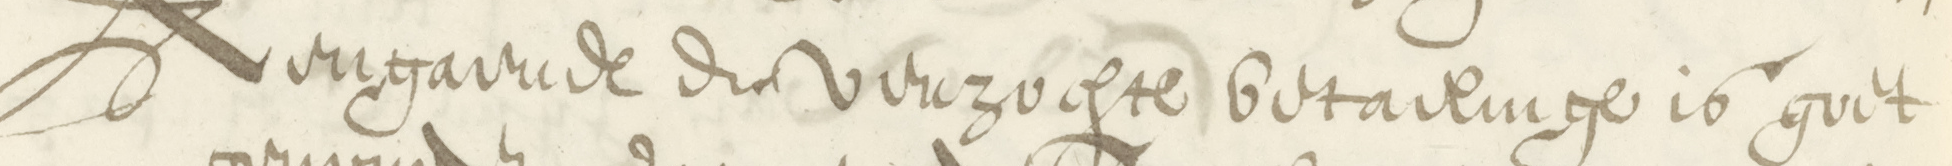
Aengaende de verzochte betaelinge is goet
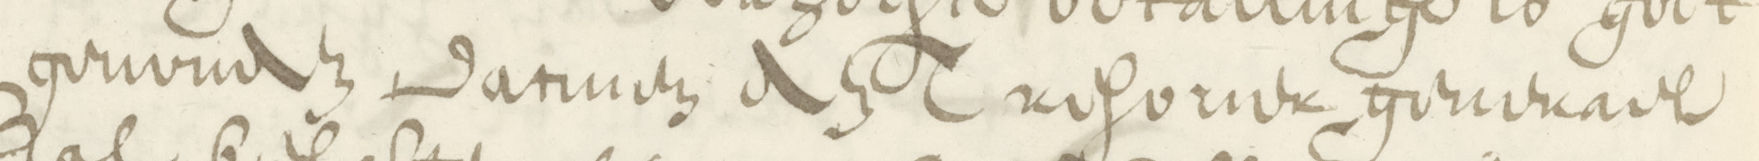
geuonden, datmen den Tresorier genenael
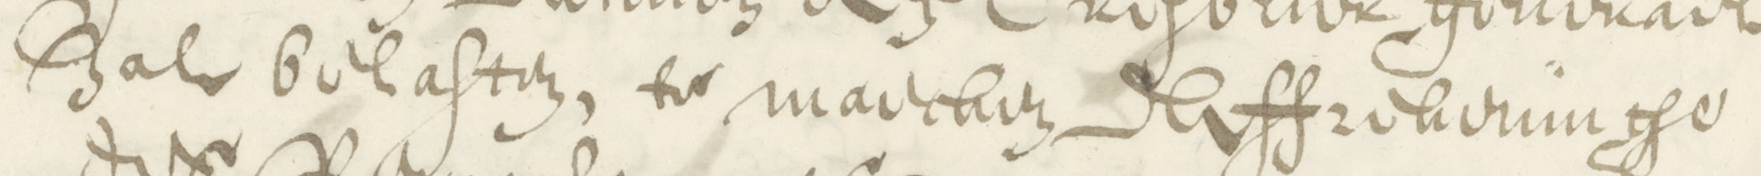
zal belasten, te maecken daffrekeninghe
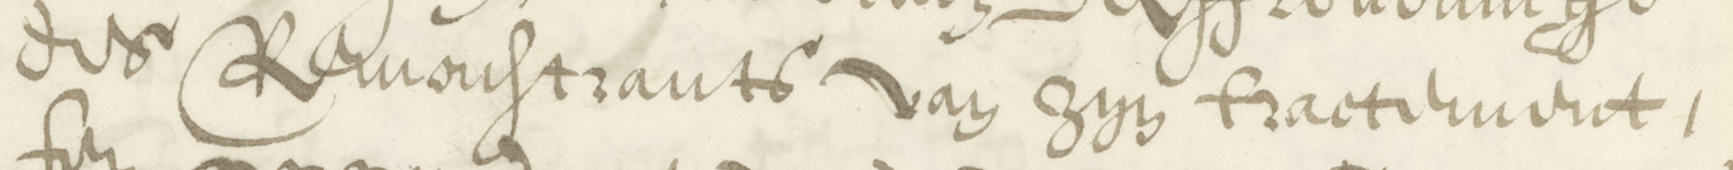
des Remonstrants van zijn tractement,
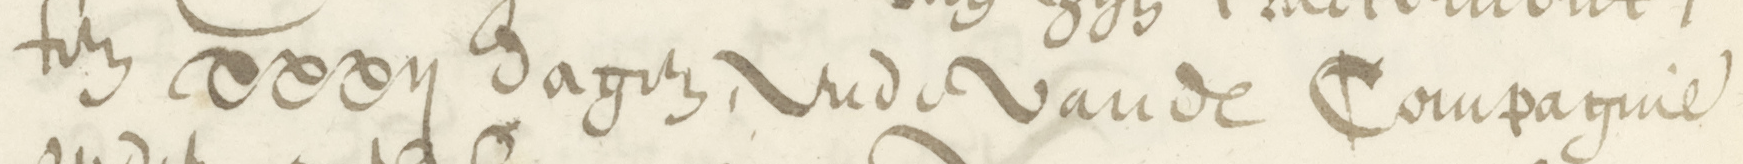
ten xxxij dagen, ende vande Compagnie
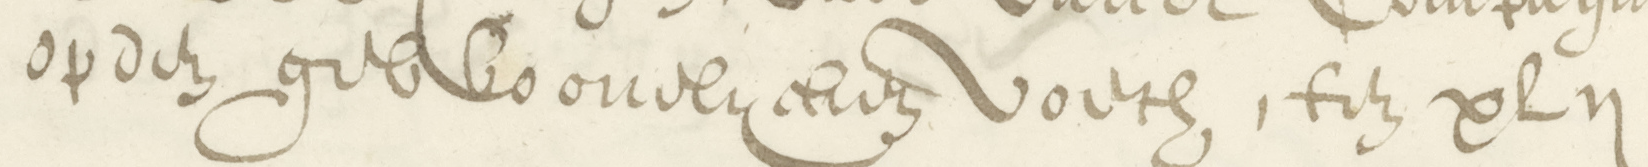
opden gewoonelycken voeth, ten xlij.
